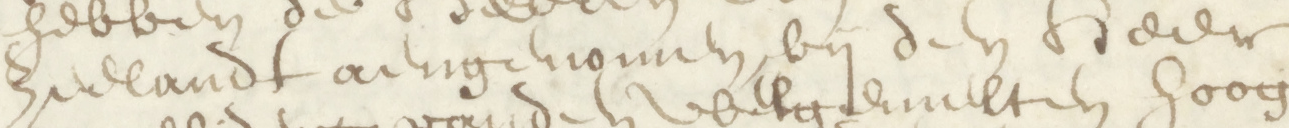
Zeelandt aengenomen bij den Heer
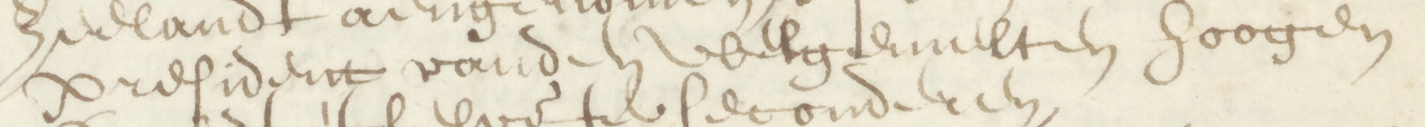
President vanden welgemelten Hoogen
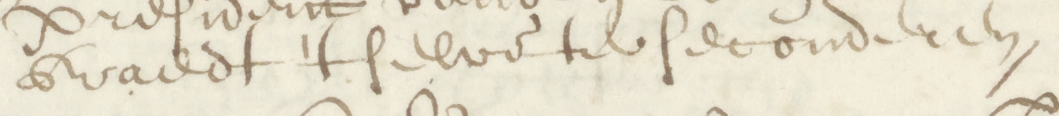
Raedt 't selve te seconderen
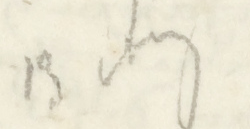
13 Aug
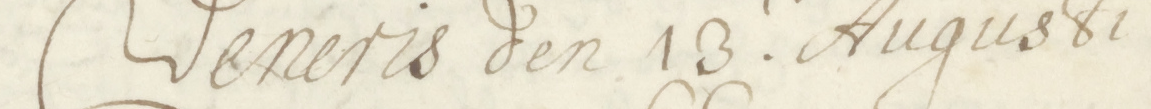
Veneris den 13en. Augusti
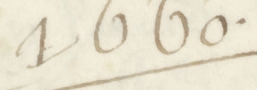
1660
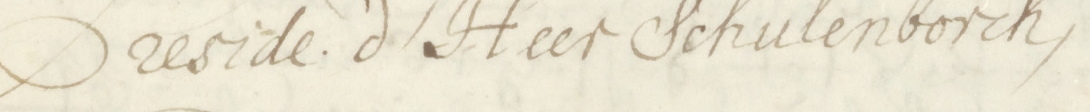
Preside d'Heer Schulenborch,
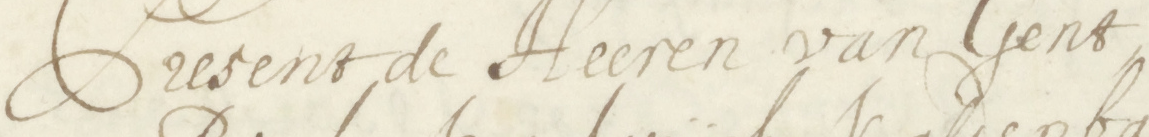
Present de Heeren van Gent
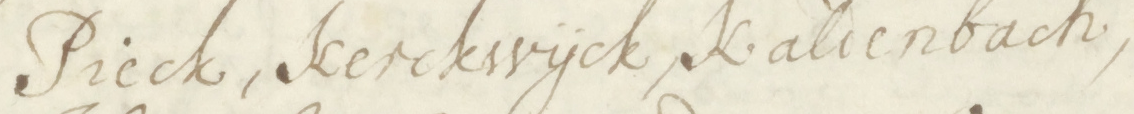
Pieck, Kerckwijck, Kaldenbach
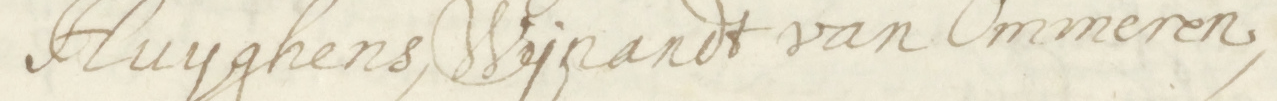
Huyghens, Wijnandt van Ommeren,
